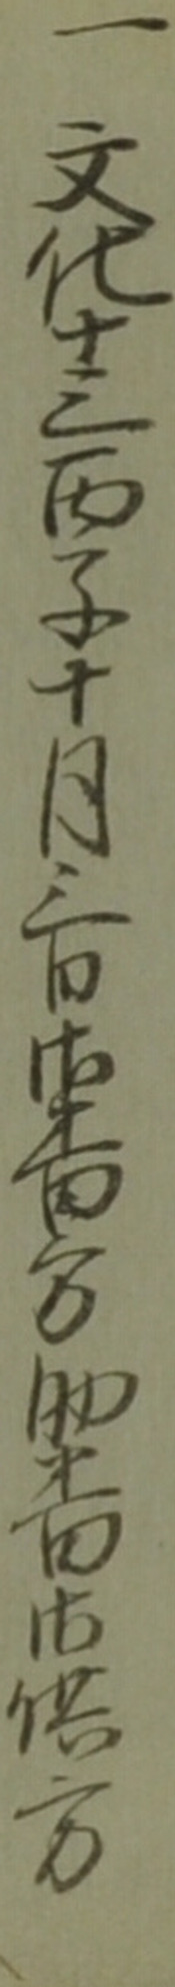一文化十三丙子十月三日御番可助番御供方
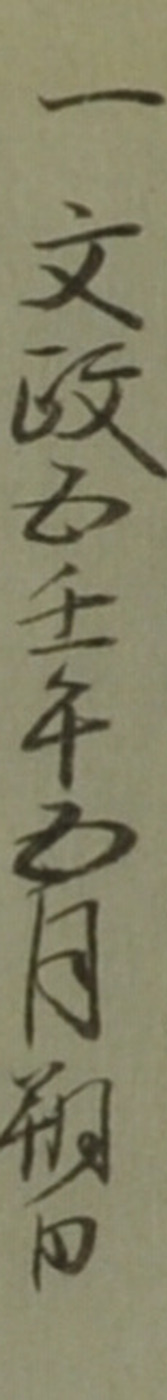一文政五壬午五月朔日
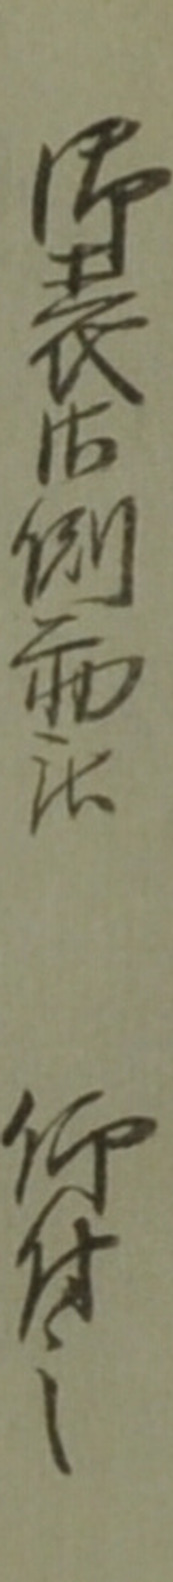御表御側勤被仰付之
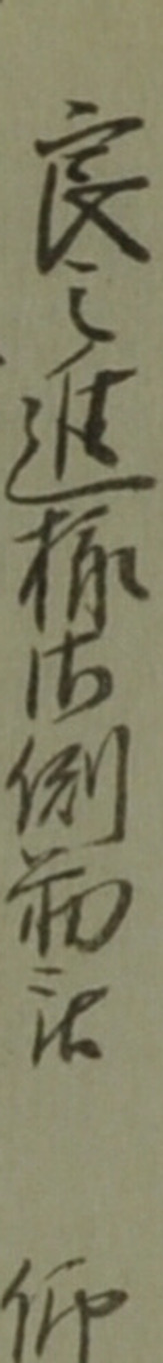良之進様御側勤被仰付之
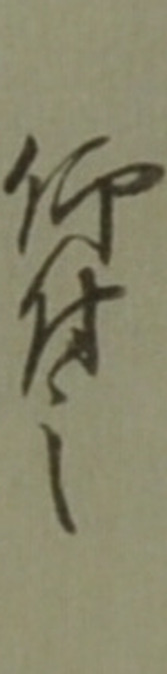仰付之
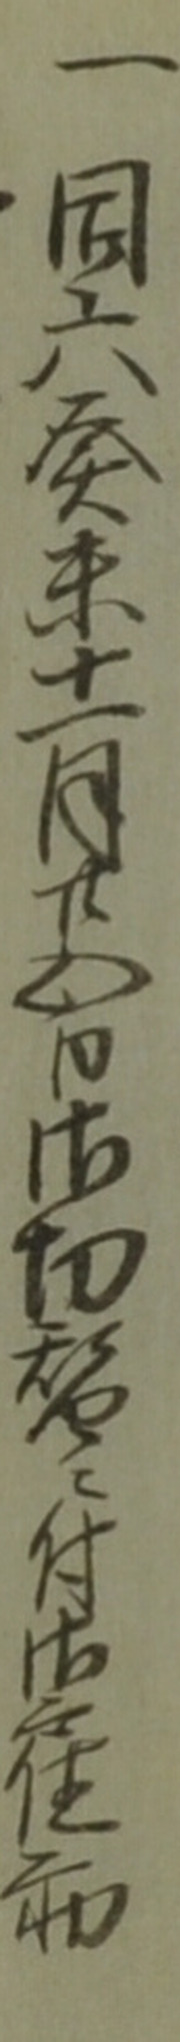一同六癸未十一月廿五日御切替ニ付御雇勤
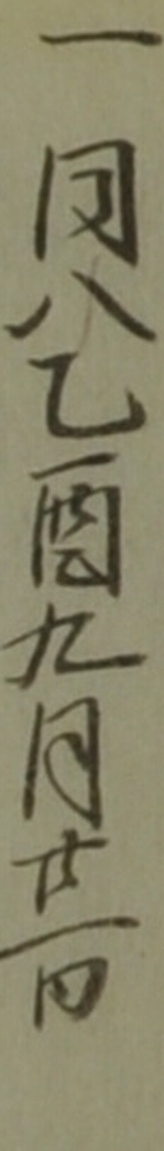一同八乙酉九月廿一日
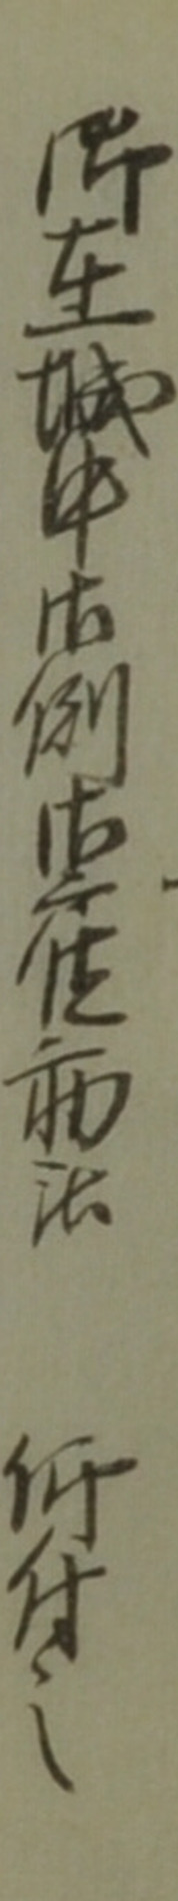御在城中御側御雇勤被仰付之
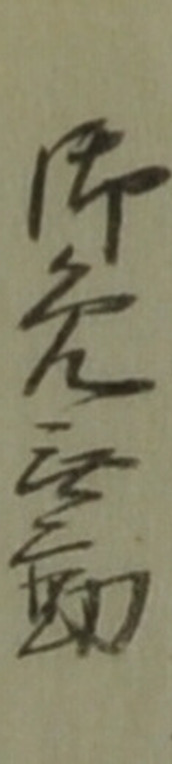御免無勤
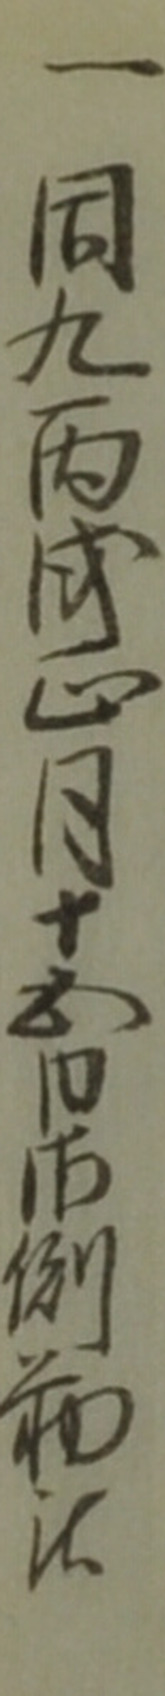一同九丙戌正月十五日御側勤被
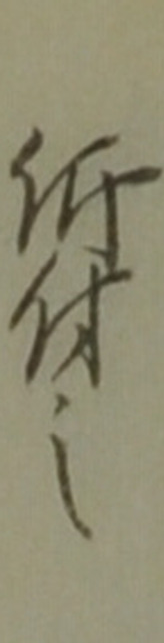仰付之
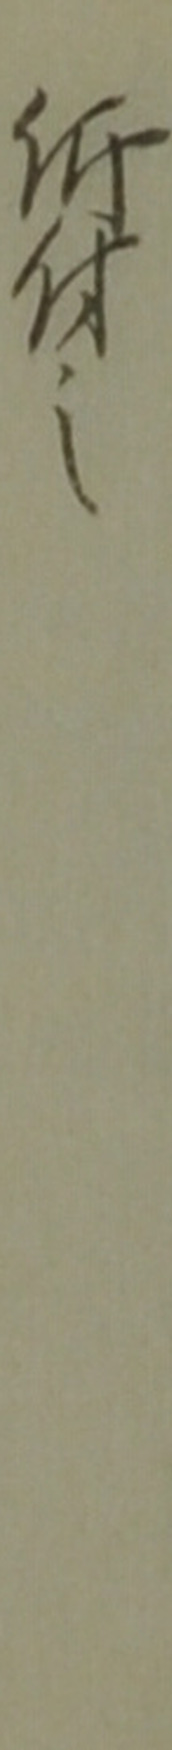仰付之
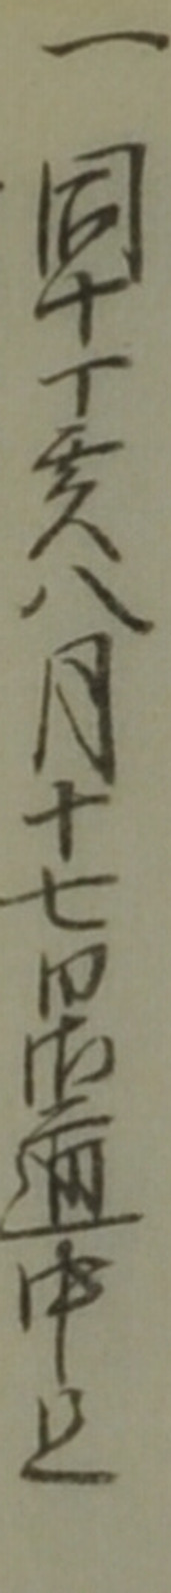一同十丁亥八月十七日御道中且
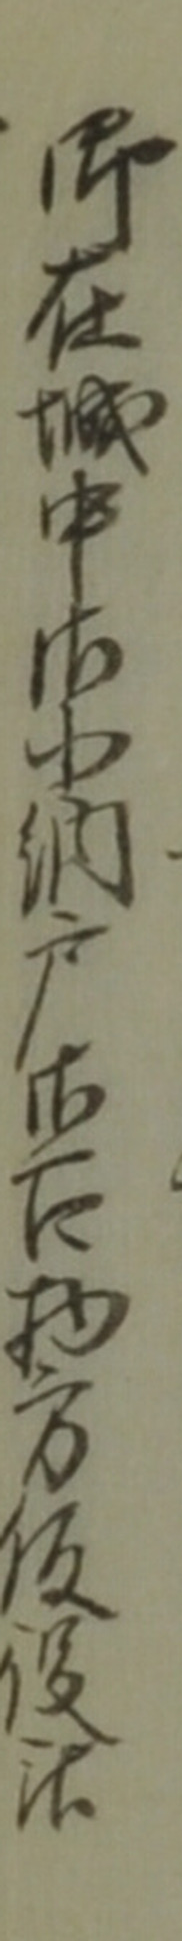御在城中御小納戸御召物方仮役被
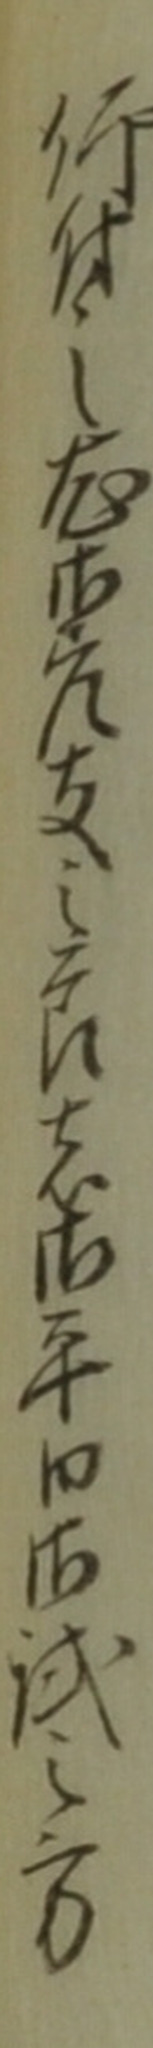仰付之尤御差支之節者御平日御試之可方
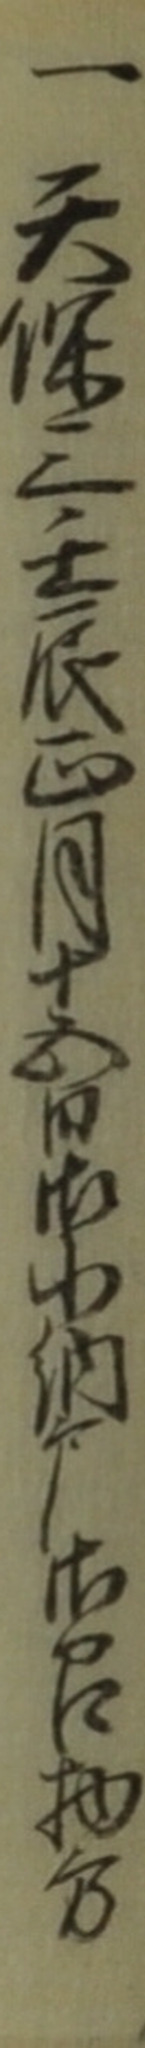一天保三壬辰正月十五日御小納戸御召物方
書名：諸御役代々録（五）
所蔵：伊那市立高遠町図書館・合同会社AMANE
